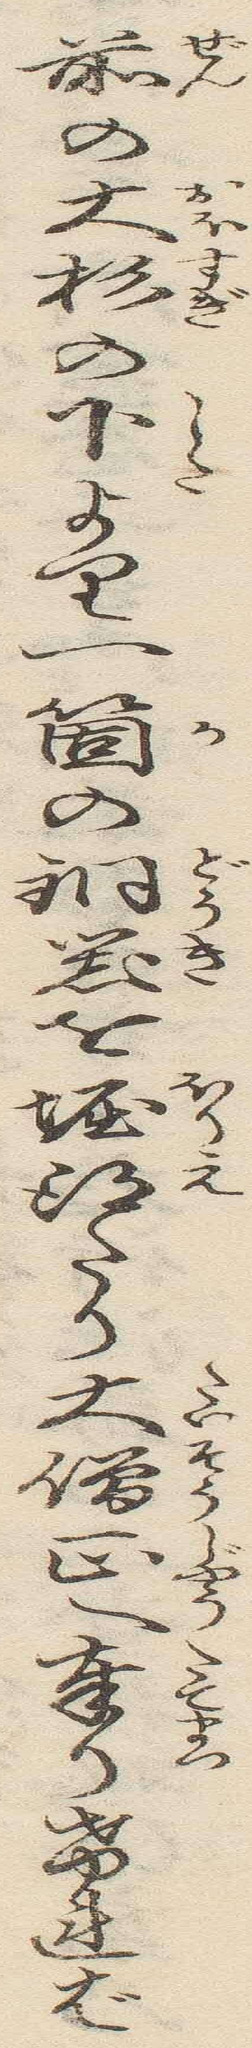前の大杉の下より一箇の銅器を堀得たり大僧正へ奉りければ
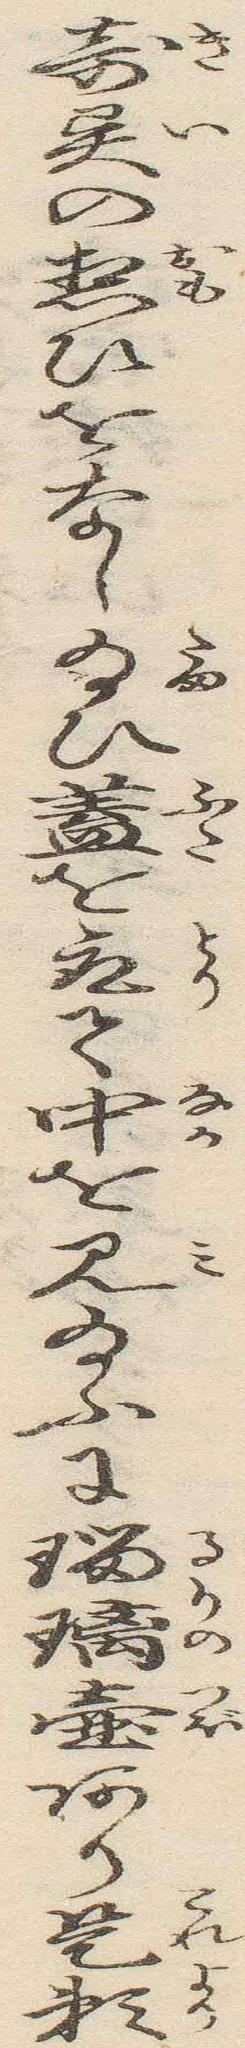奇異の想ひをなし給ひ蓋を取て中を見給ふに瑠璃壷あり是頼
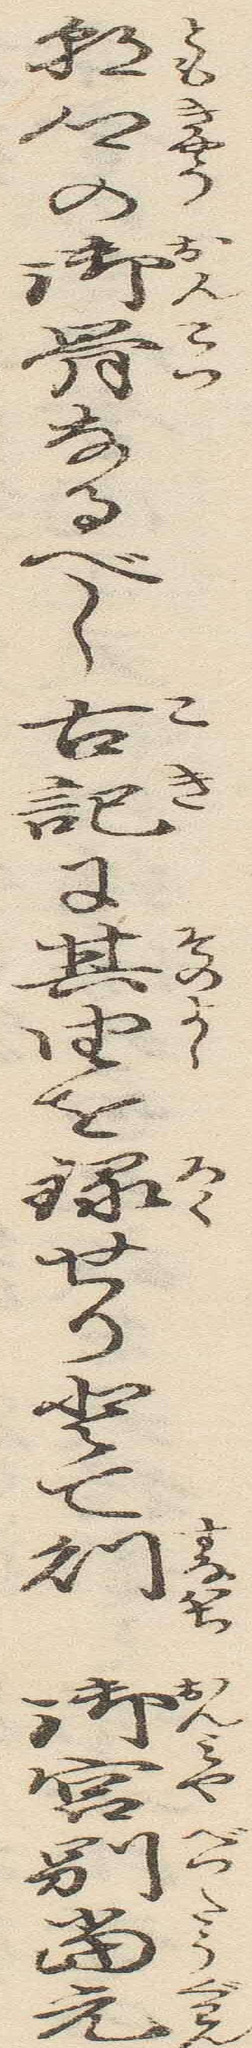朝卿の御骨なるべし古記に其由を録せりとて即御宮別當元
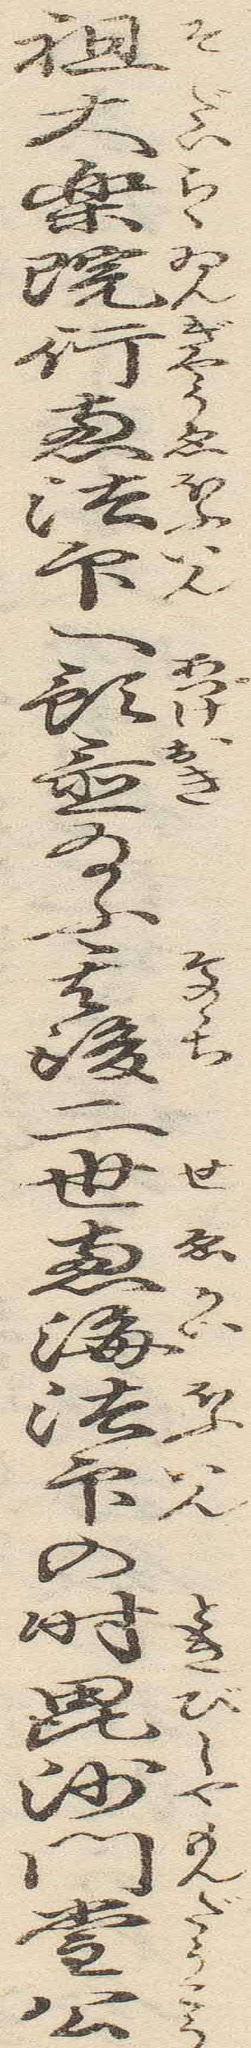祖大楽院行恵法印へ預置給ふ其後二世恵海法印の时毘沙門堂公
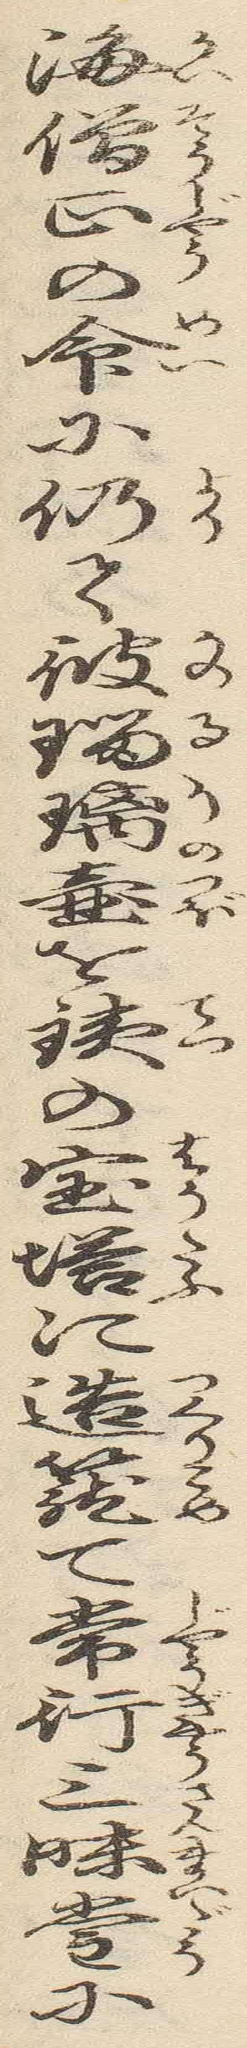海僧正の命に仍て彼瑠璃壷を銕の宝塔に造籠て常行三昧堂に
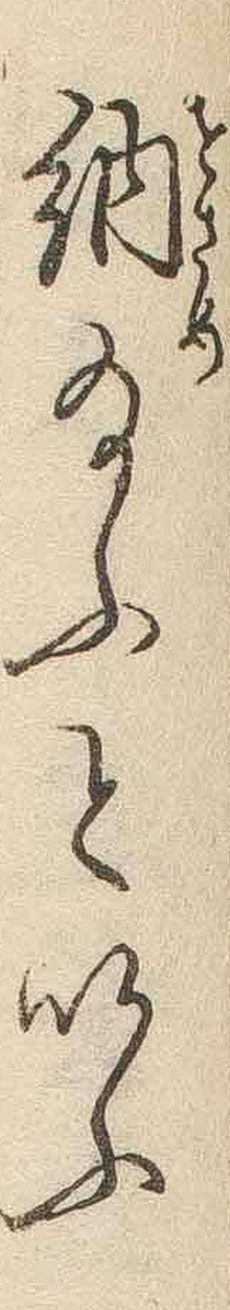納給ふといふ
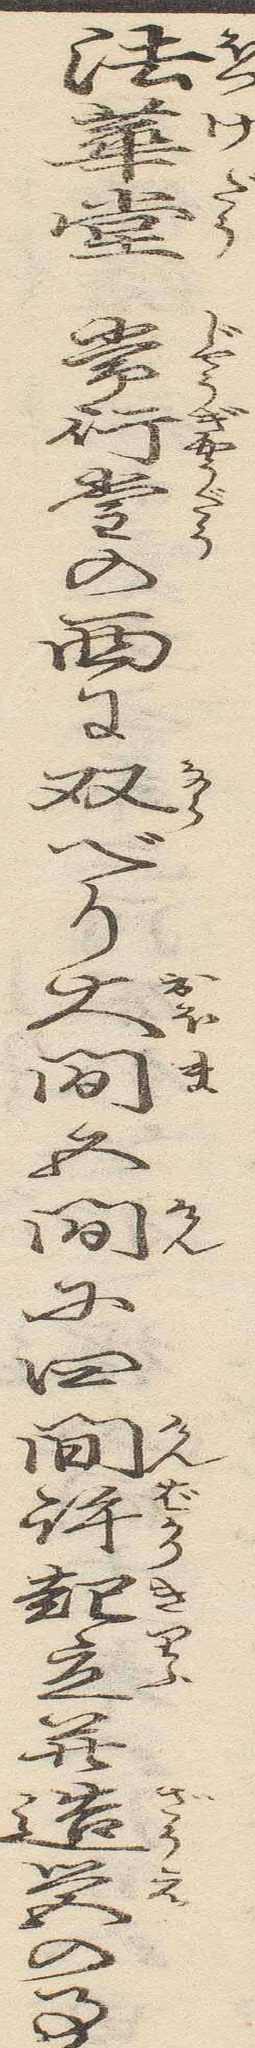法華堂常行堂の西に双べり大間五間に四間許起立并造営の事
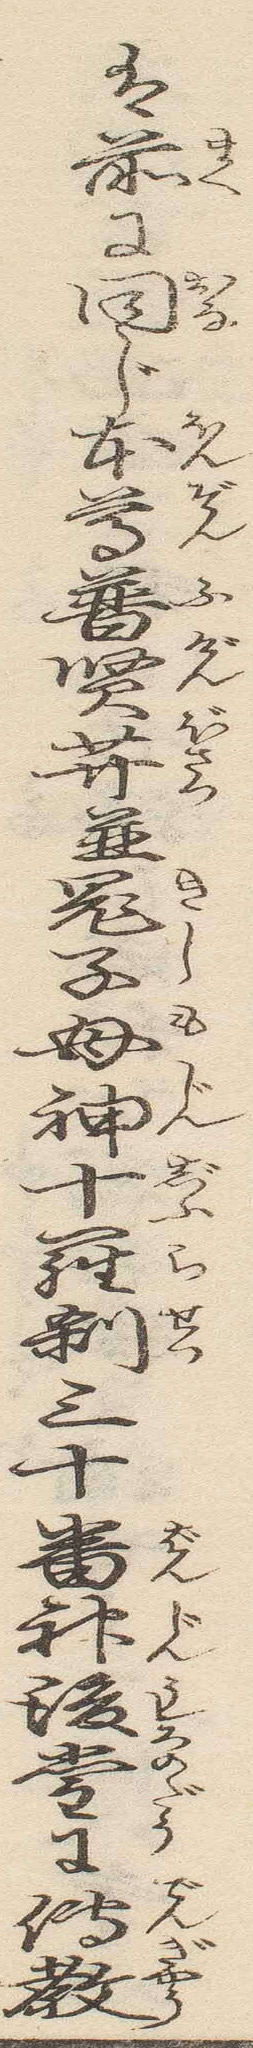は前に同じ本尊普䝨𦬇並鬼子母神十羅刹三十番神後堂に傳教
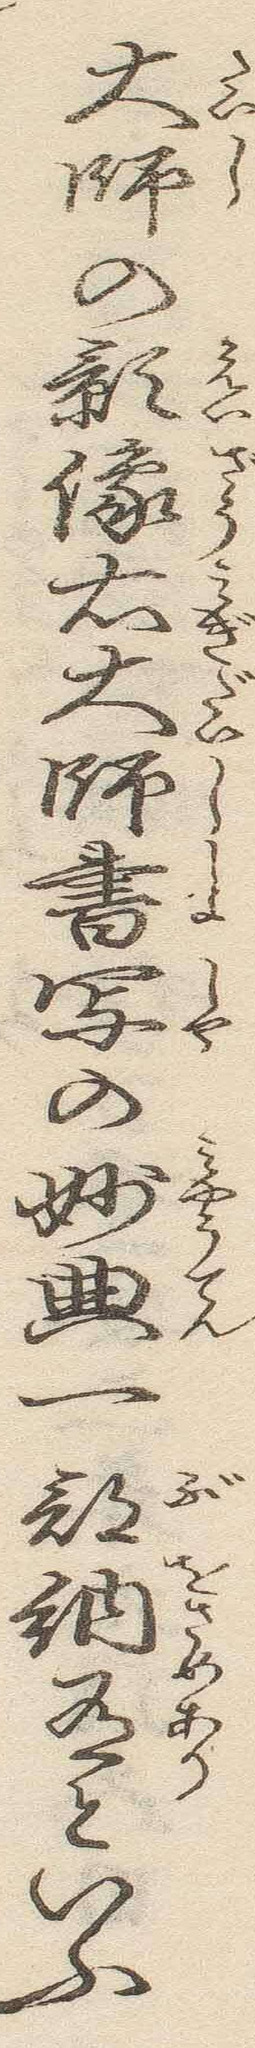大師の影像右大師書写の妙典一部納有といふ
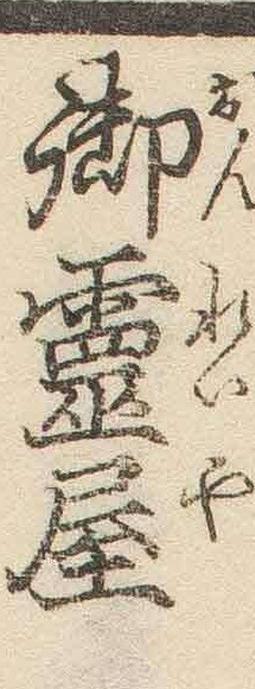御靈屋
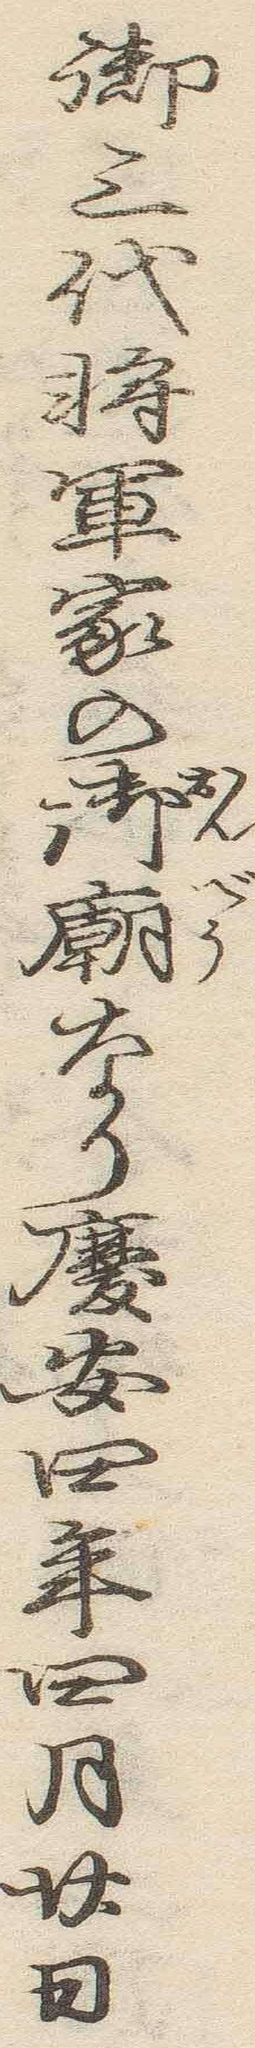御三代將軍家の御廟なり慶安四年四月廿日
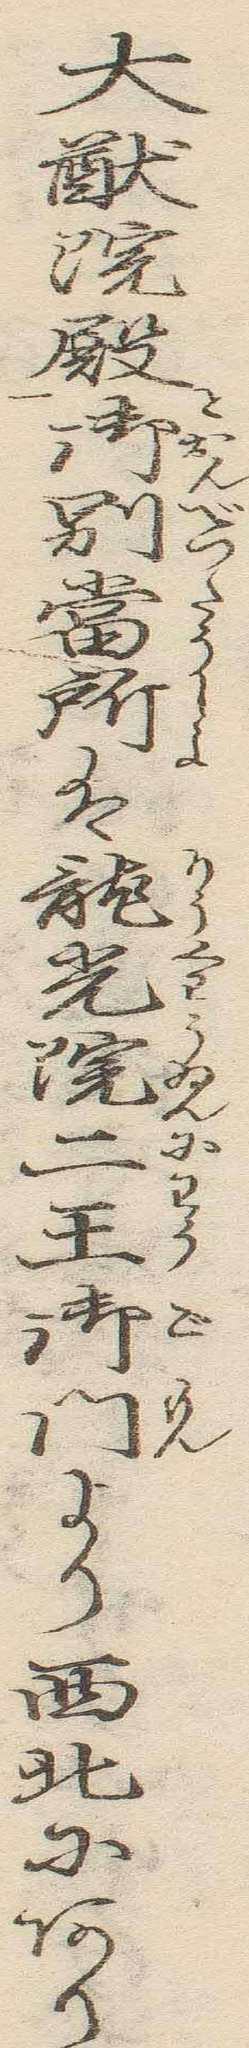大猷院殿御別當所は龍光院二王御門より西北にあり

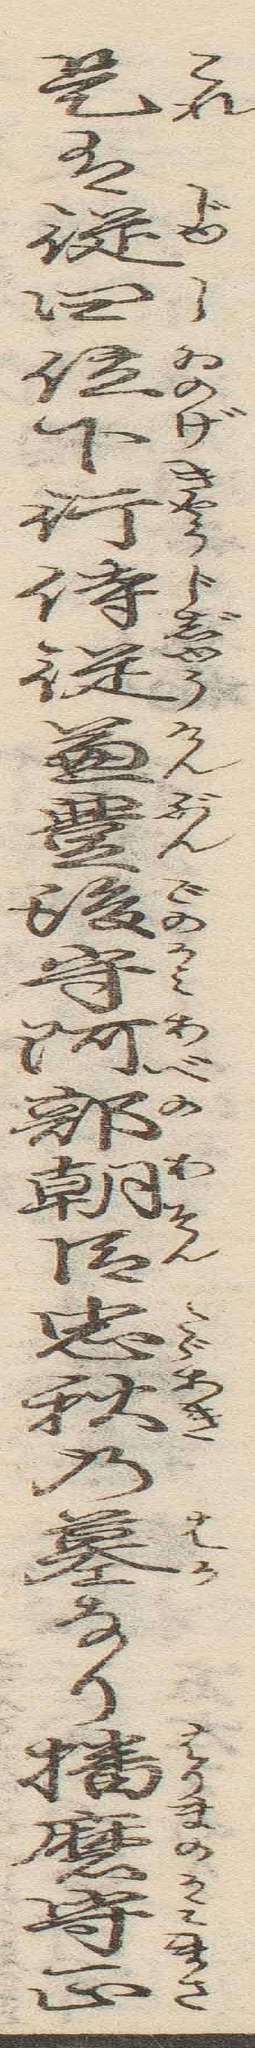是は従四位下行侍従兼豊後守阿部朝臣忠秋の墓なり播磨守正
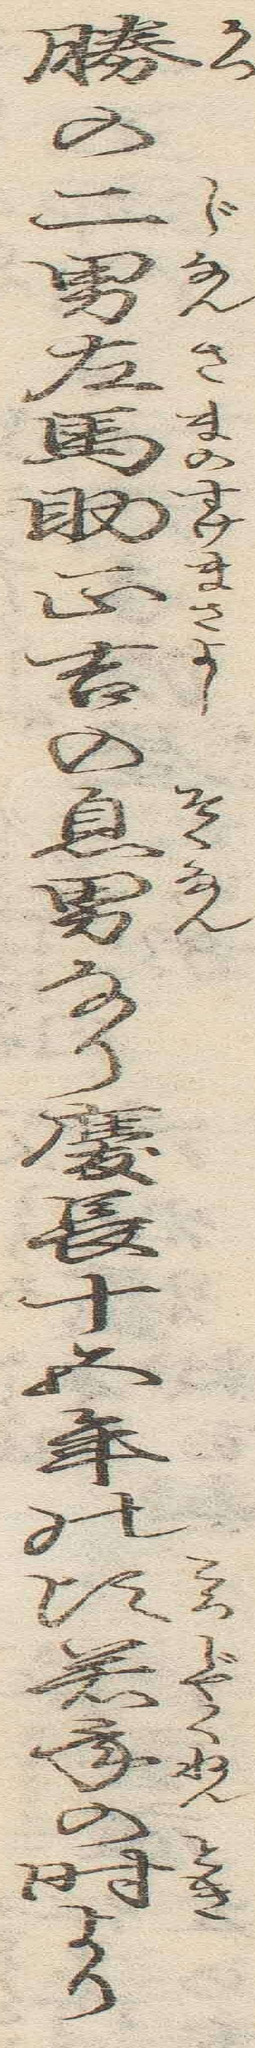勝の二男左馬助正吉の息男なり慶長十五年の頃若年の时より
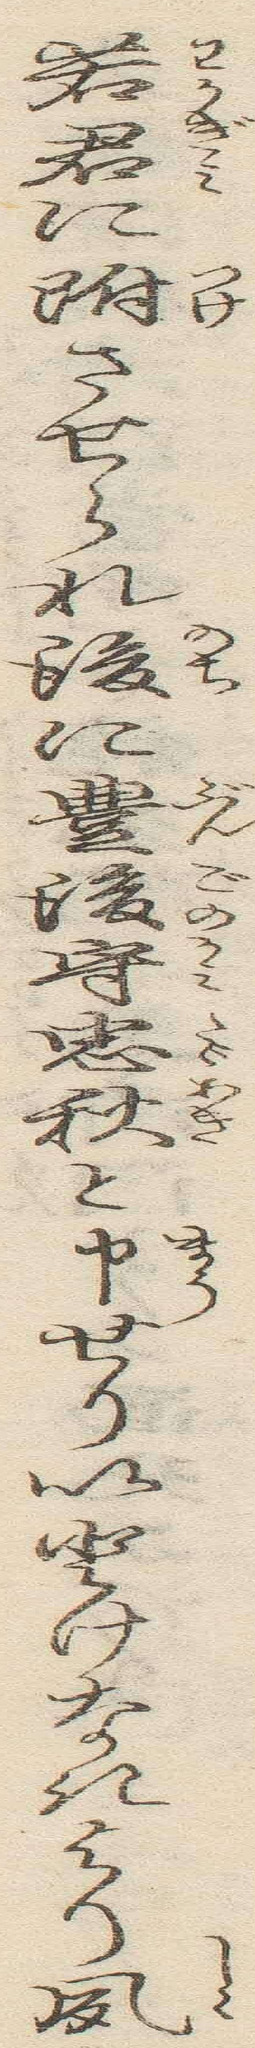若君に附させられ後に豊後守忠秋と申せりいとけなきより夙
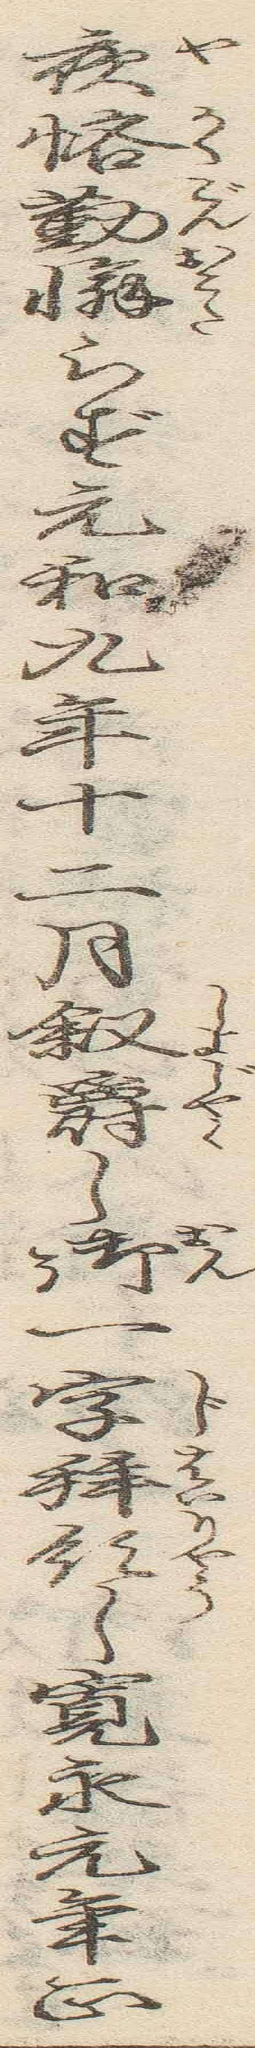夜恪勤懈らず元和九年十二月叙爵し御一字拜領し寛永元年正
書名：日光山志
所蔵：東京学芸大学附属図書館 国文学研究資料館
